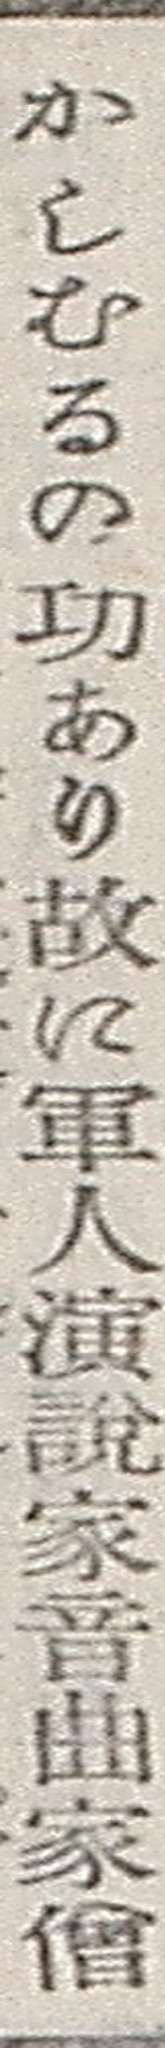かしむるの功あり故に軍人演説家音曲家僧
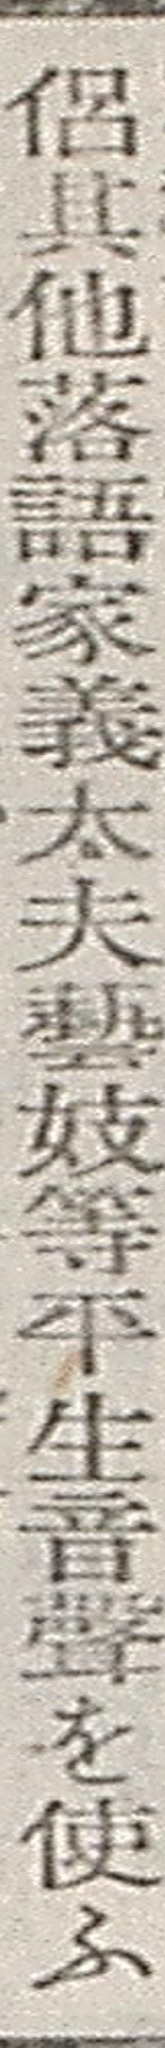侶其他落語家義太夫芸妓等平生音声を使ふ
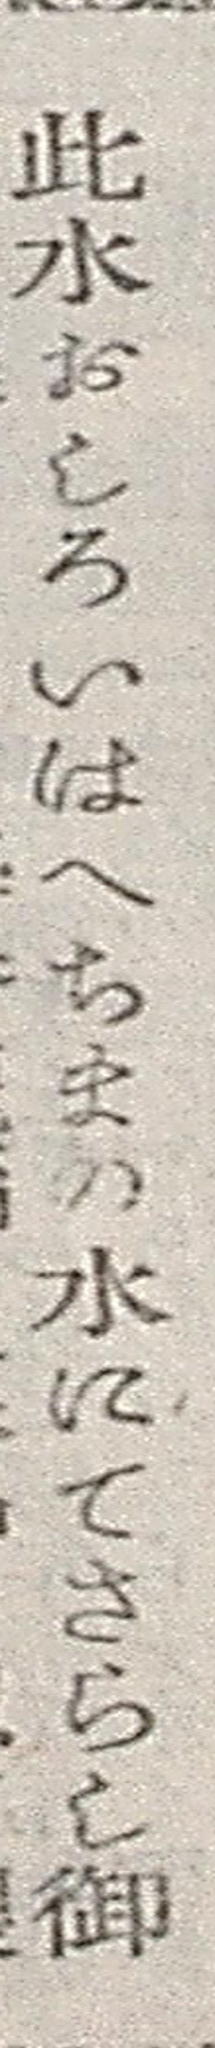此水おしろいはへちまの水にてさらし御
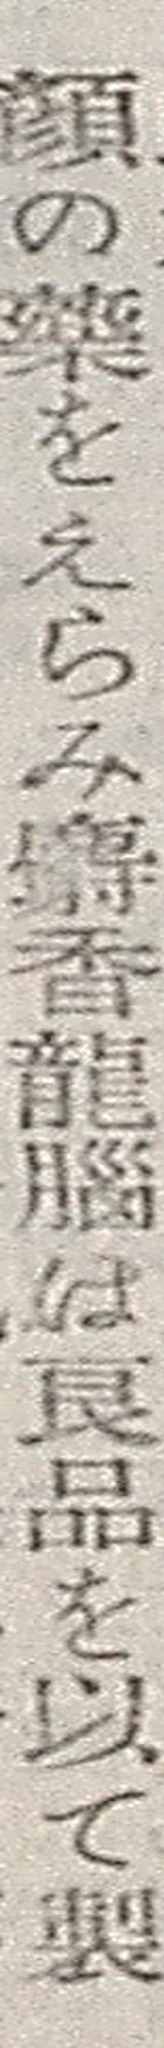顔の薬をえらみ麝香龍脳は良品を以て製
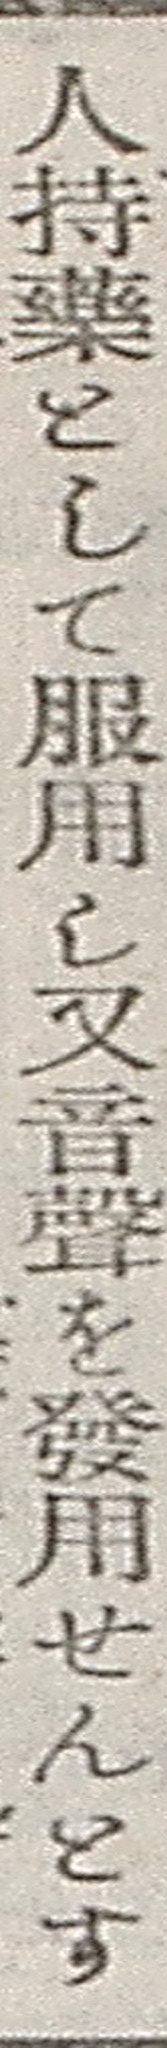人持薬として服用し又音声を発用せんとす
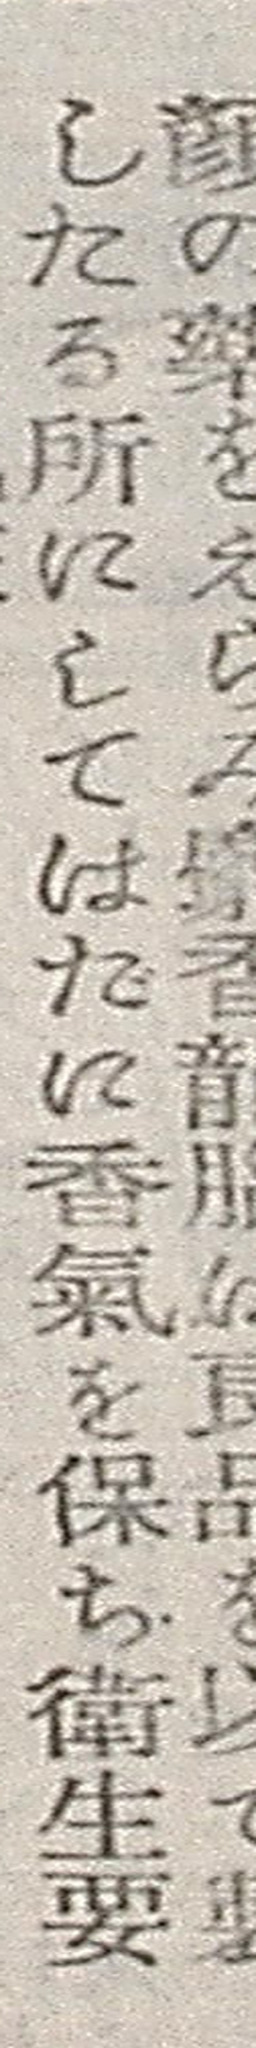したる所にしてはたに香気を保ち衛生要
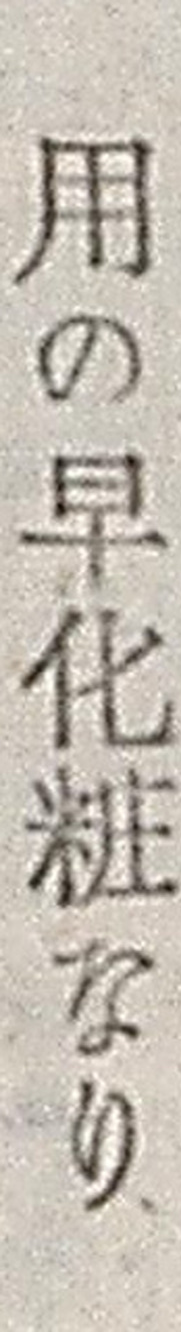用の早化粧なり
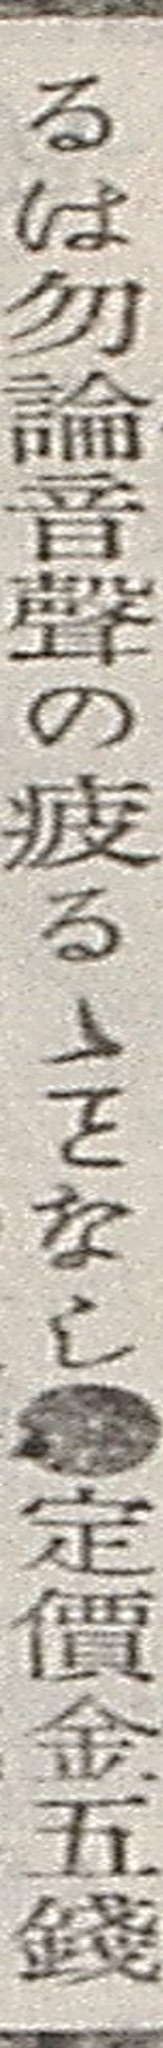るは勿論音声の疲るゝことなし●定価金五銭
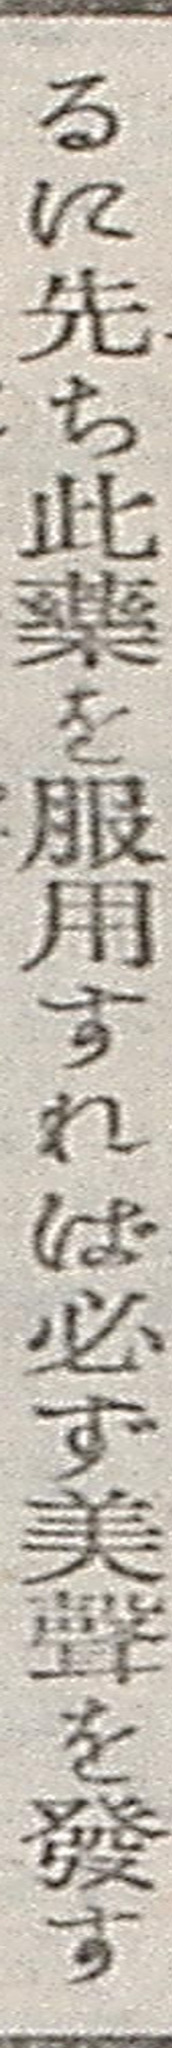るに先ち此薬を服用すれば必ず美声を発す
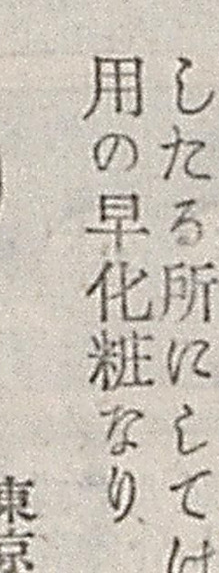用の早化粧なり
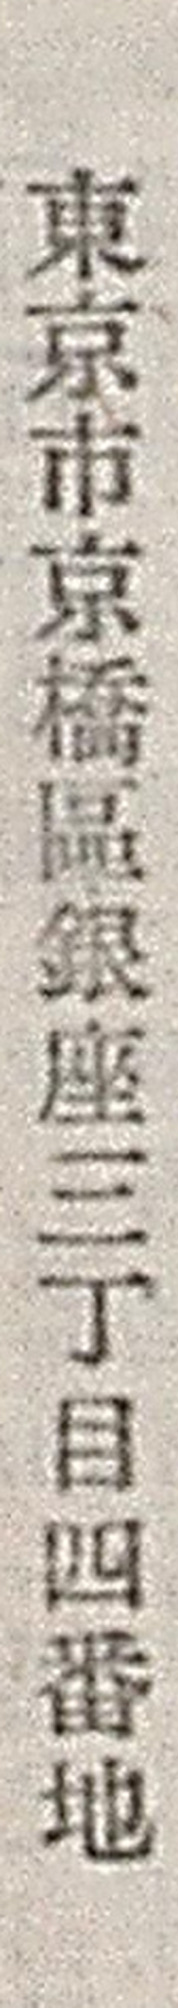東京市京橋区銀座三丁目四番地
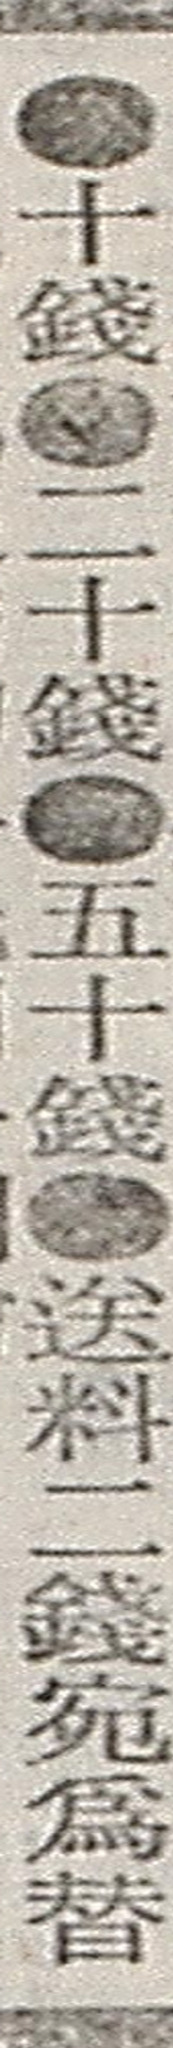●十銭●二十銭●五十銭●送料二銭宛為替
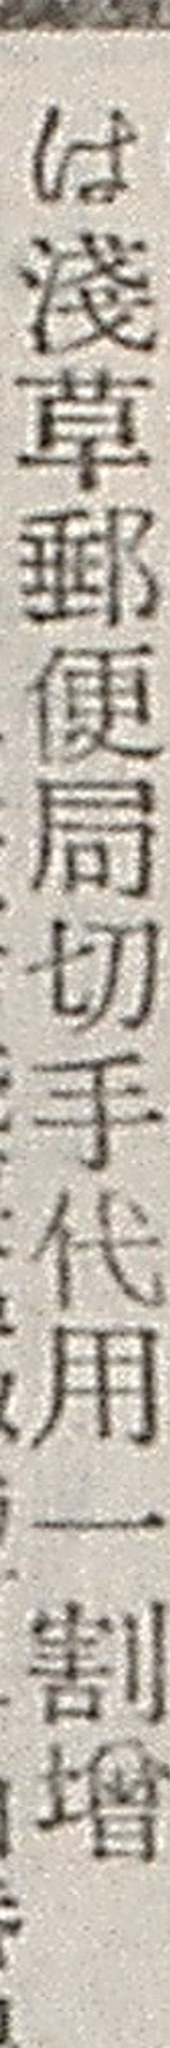は浅草郵便局切手代用一割増
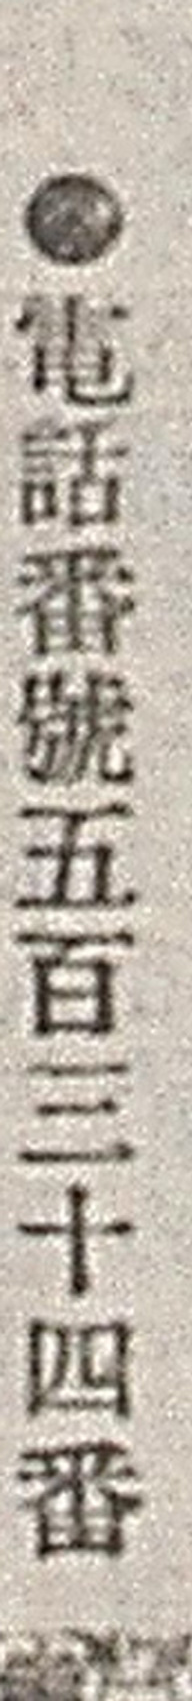●電話番号五百三十四番
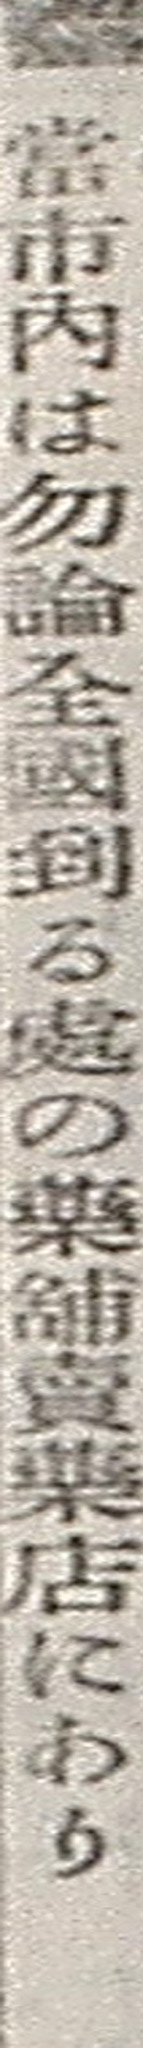当市内は勿論全国到る処の薬舗売薬店にあり
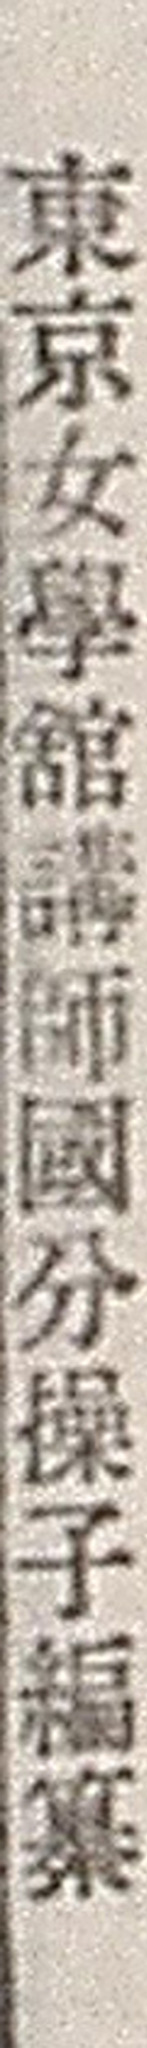東京女学舘講師国分操子編集
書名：風俗畫報臨時増刊第百二十四號　洪水地震被害録（上）
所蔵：東京大学地震研究所図書室 Earthquake Research Institute Library, The University of Tokyo, JAPAN
